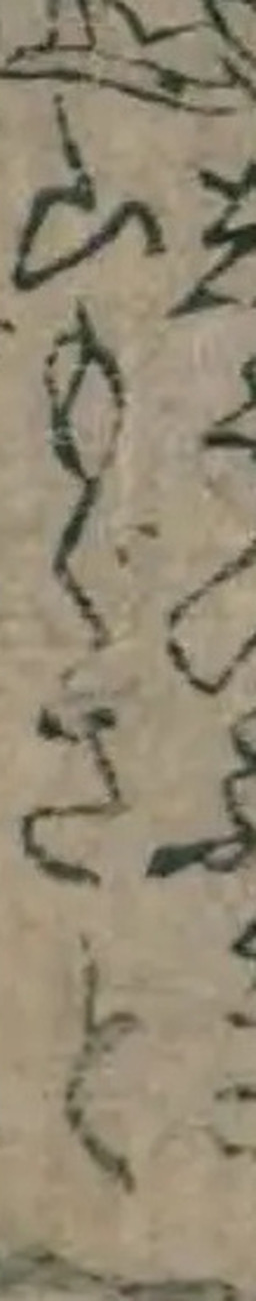山もぐさと
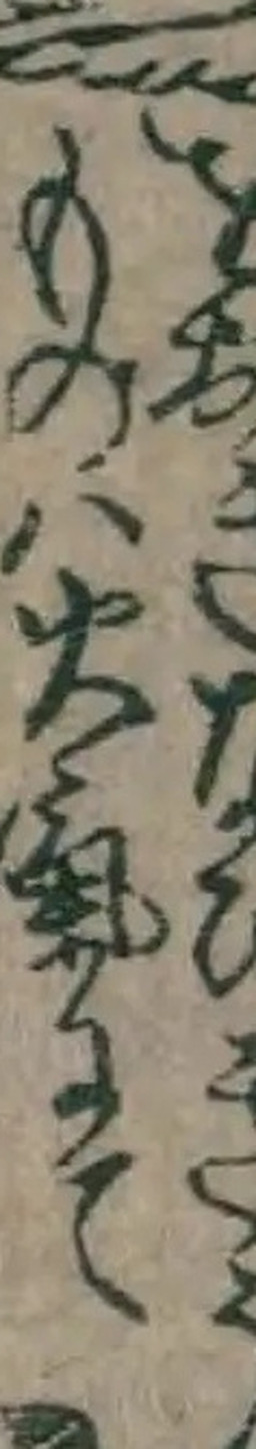ものは火気にて
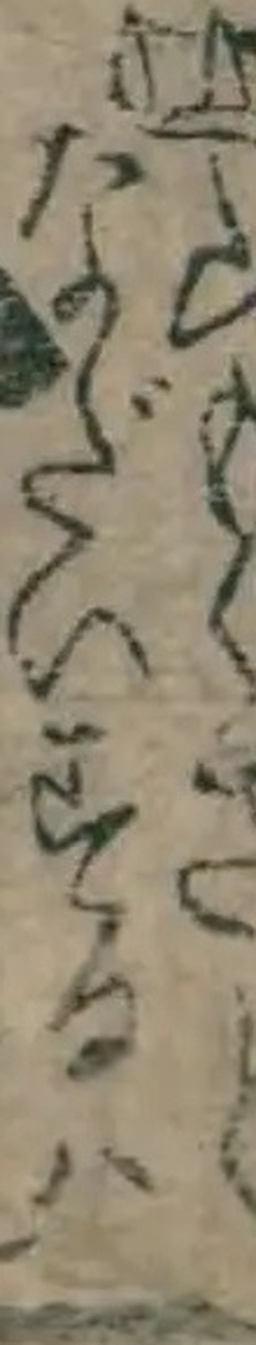なだいするは
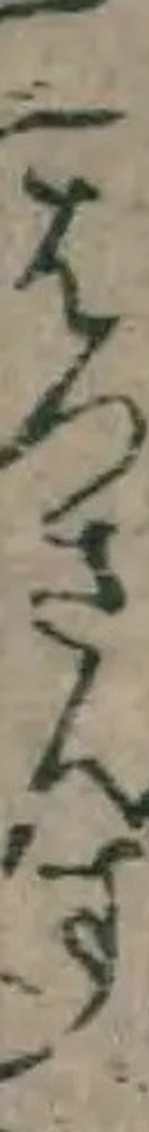はつさんす
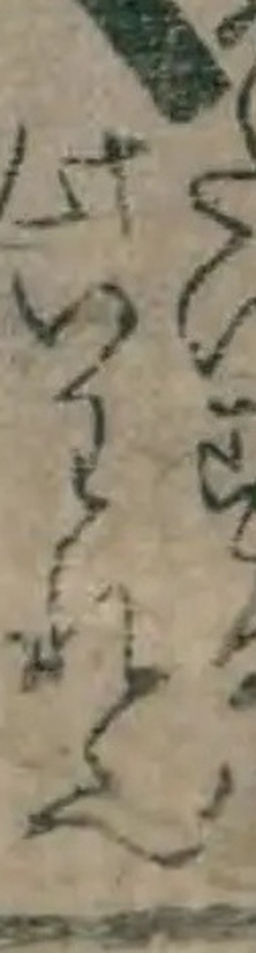此いわれ也
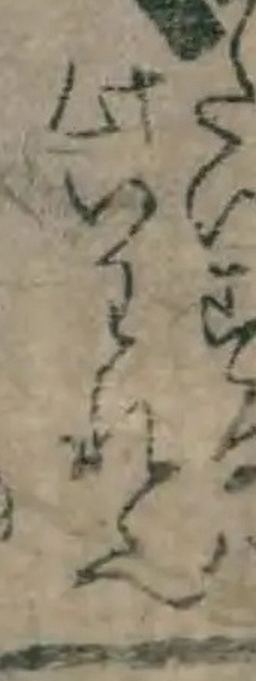此いわれ也
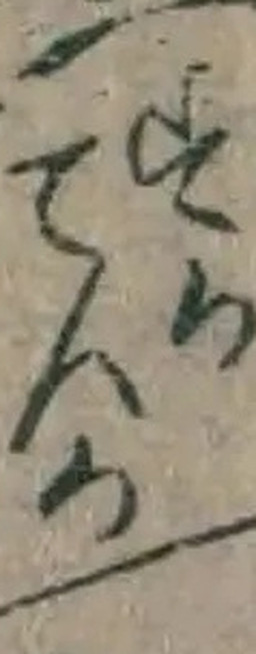てんか
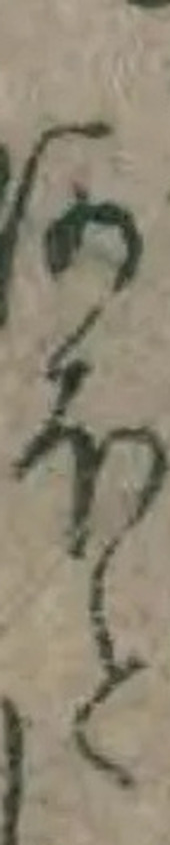何ほと

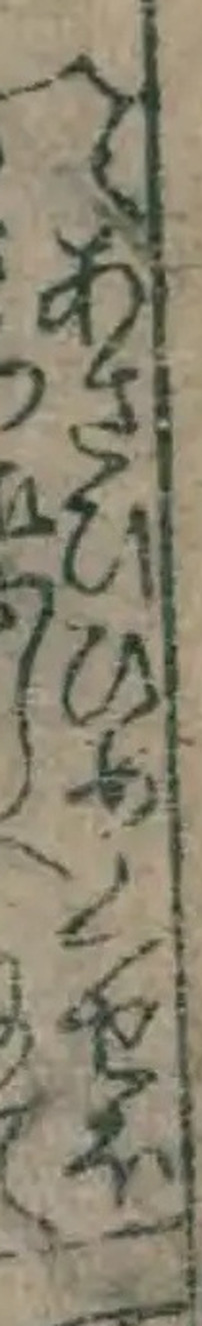あさひひめくせほ
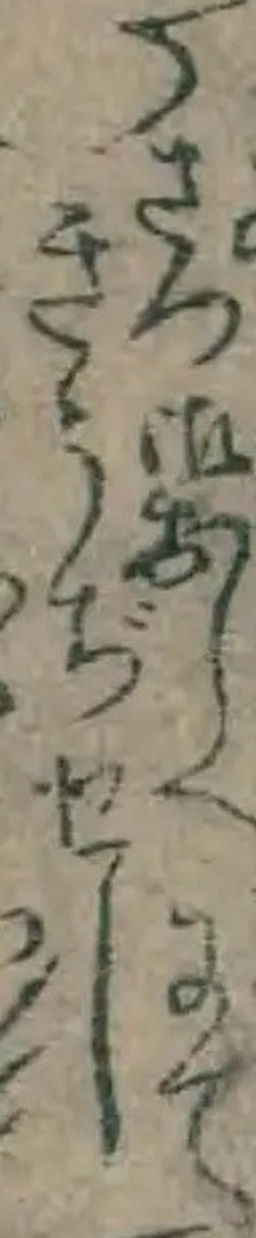きうぢせし
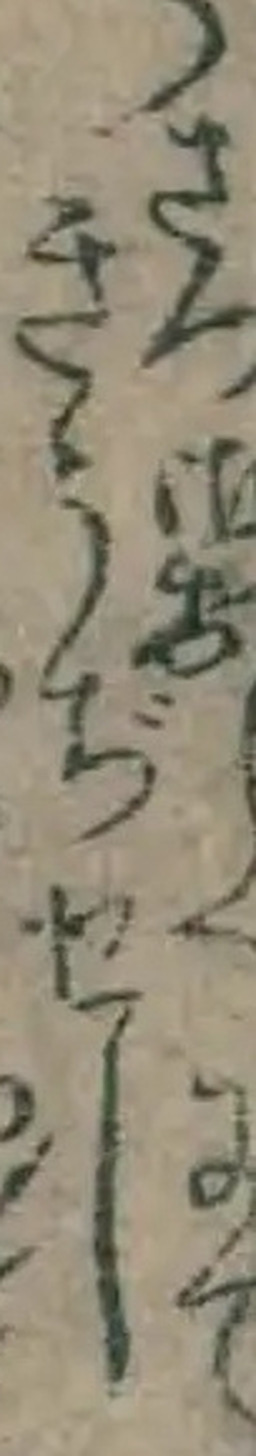きうぢせし
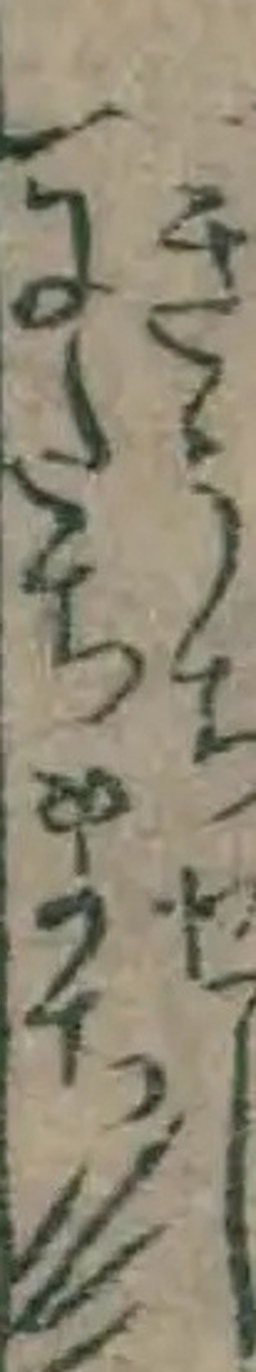にたちまち
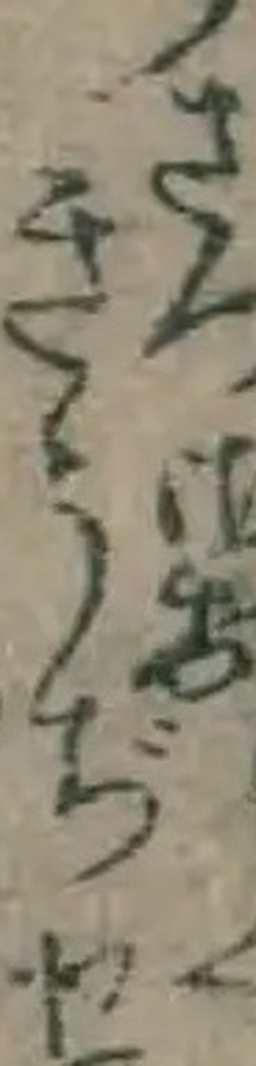きうを
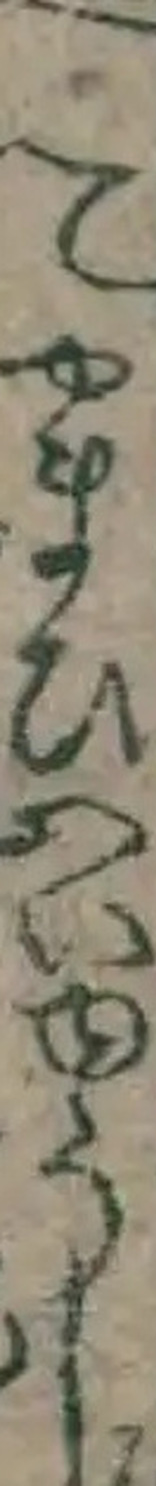やまひへいゆうし
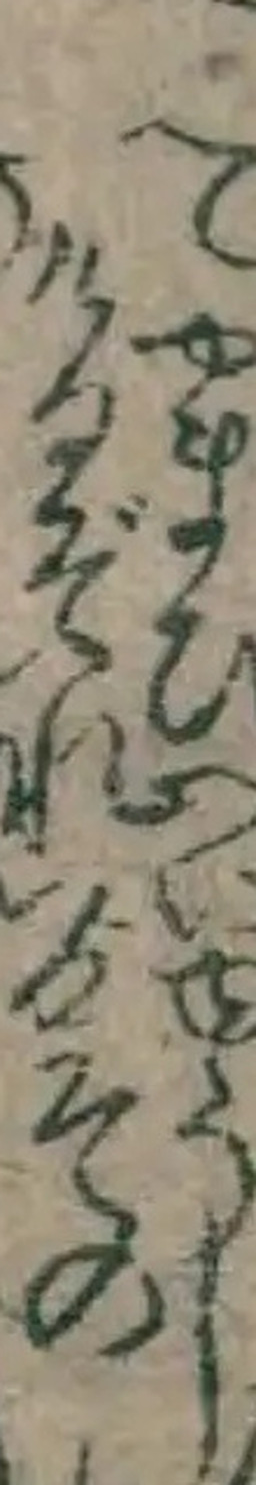けるそれよりその
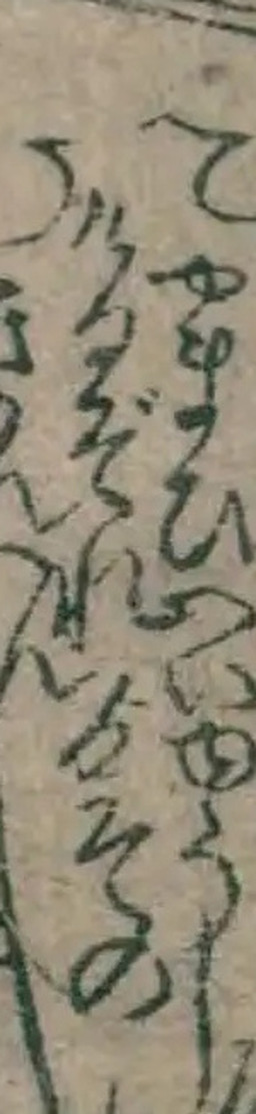けるそれよりその
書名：団十郎蓬芥伝
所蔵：国立国会図書館 National Diet Library, JAPAN
